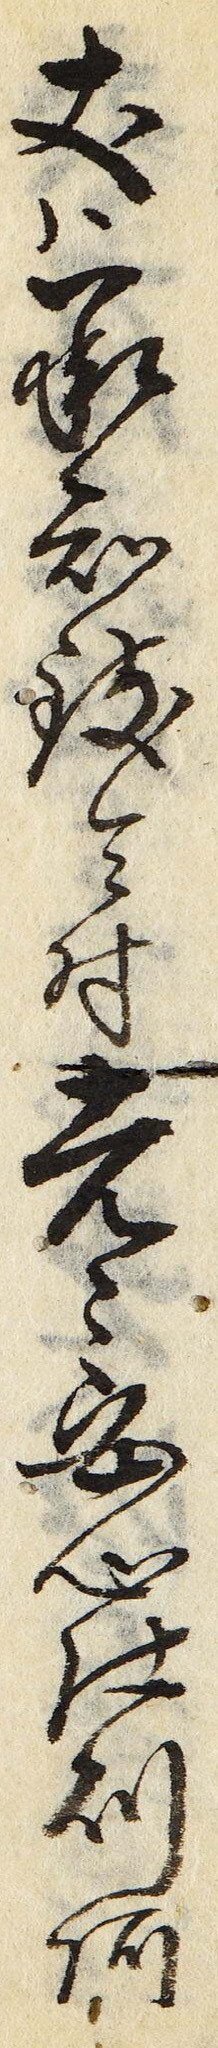丈ハ承知致候ニ付先々安心仕則阿
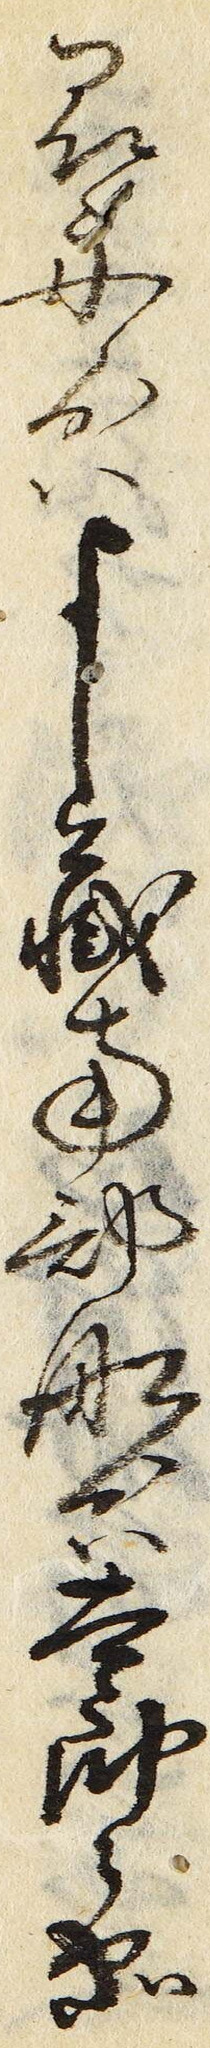州舟ゟハよし蔵南部船ゟハ太郎兵衛
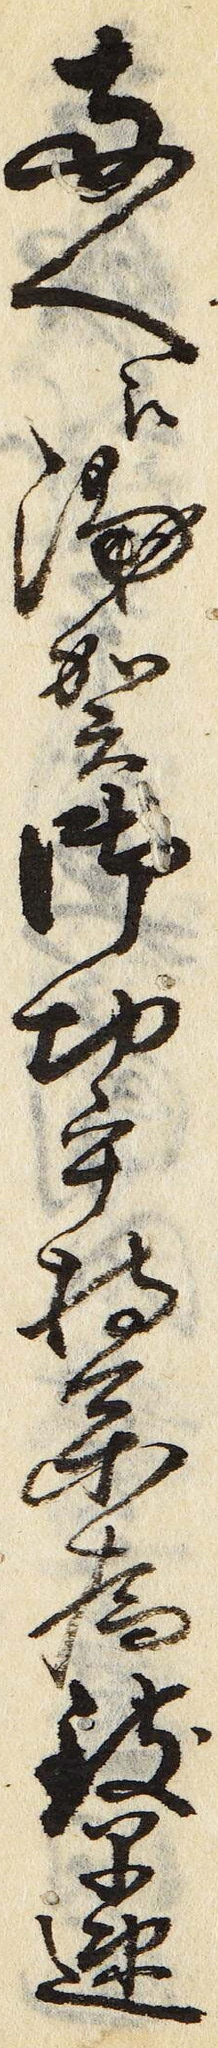両人え浦賀御切手持参為致早速
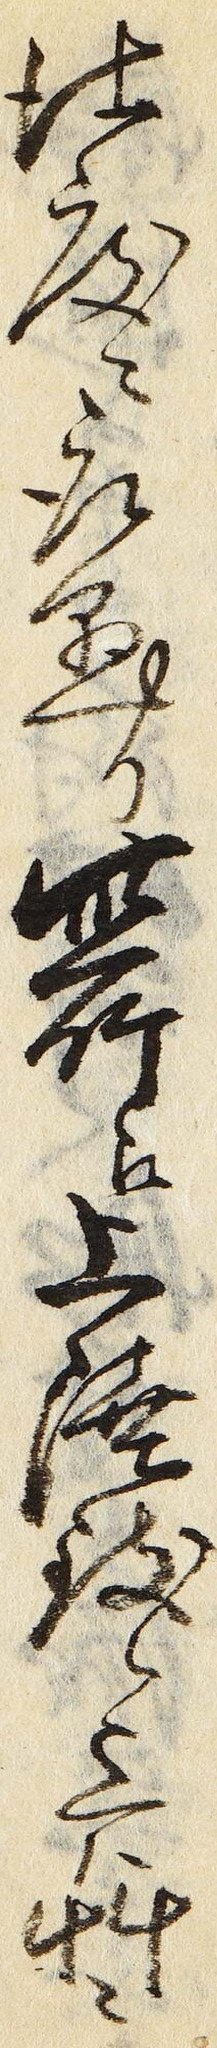仕度ニ取懸り此所え上陸致候上ハ草々
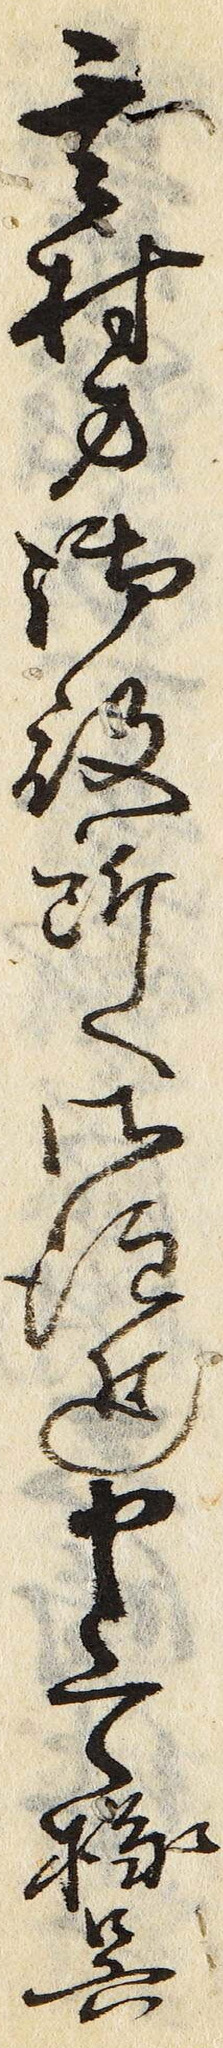其村方御役所へ御注進申上候様呉
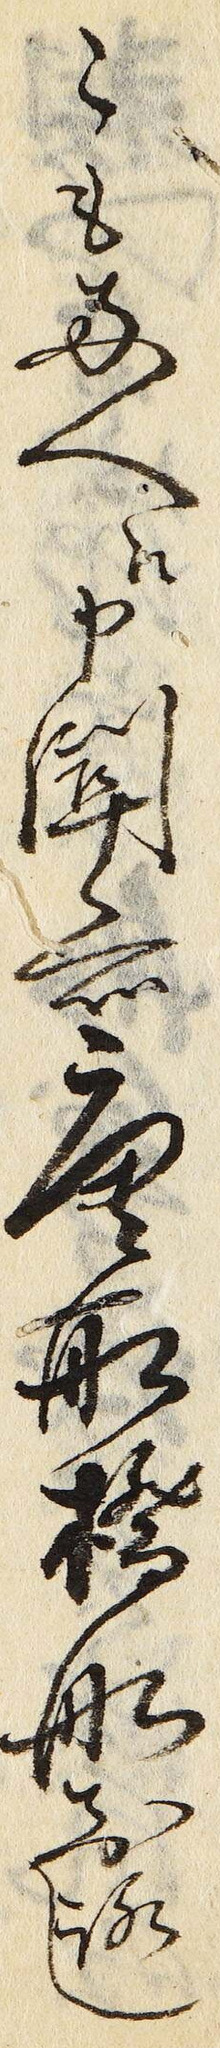々も両人え申聞候所唐船橋船おろし
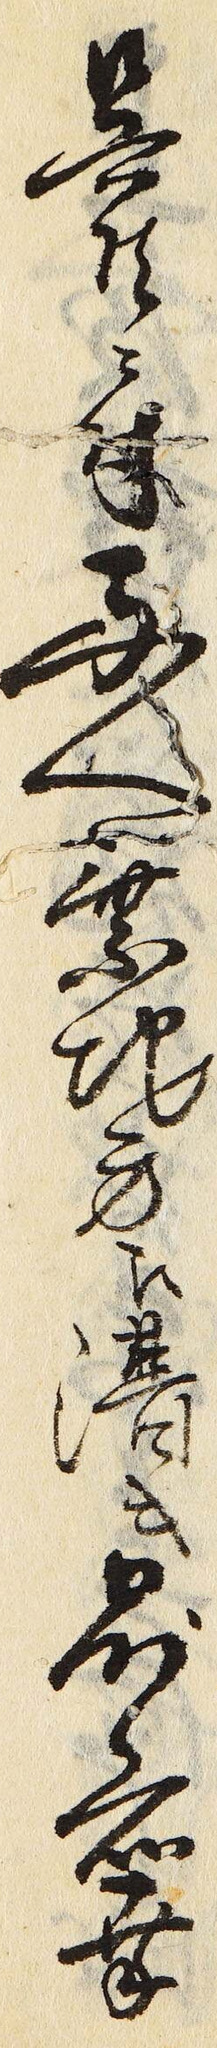呉候ニ付両人乗地方え漕キ寄候所幸
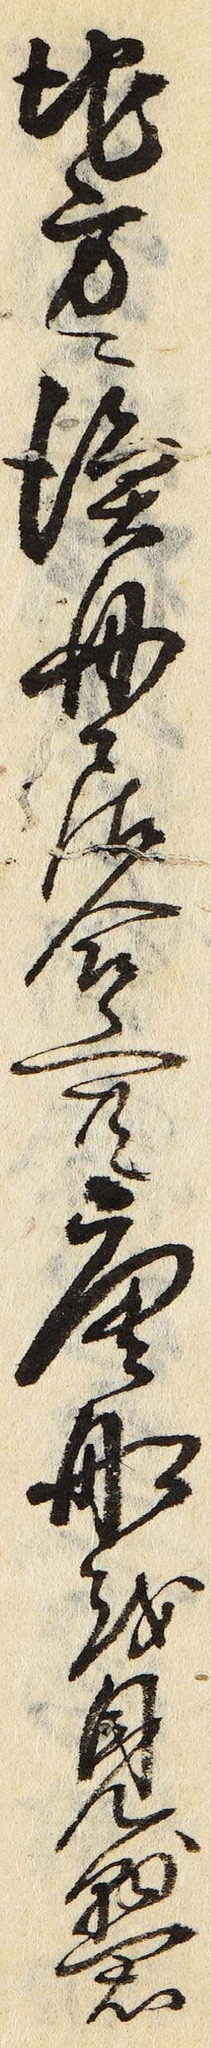地方ニ漁舟居合候へ共唐船を見懸右
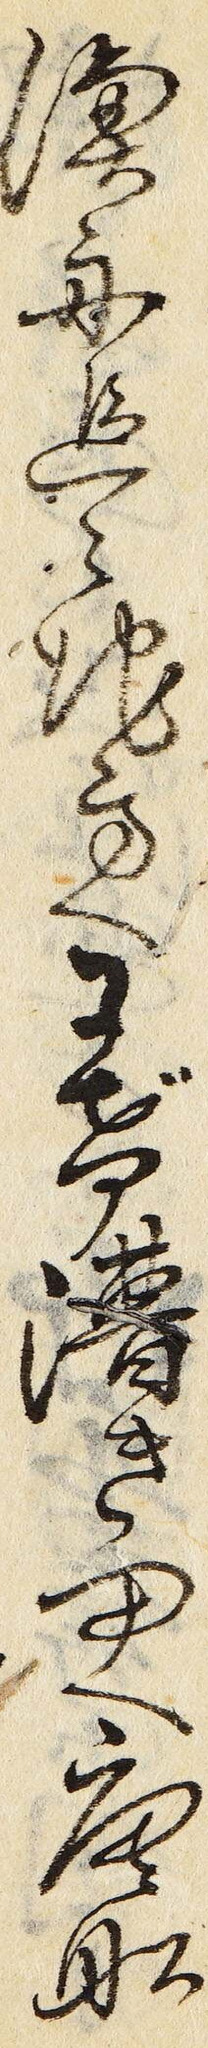漁舟追々地方へにげ漕きゆへ唐船
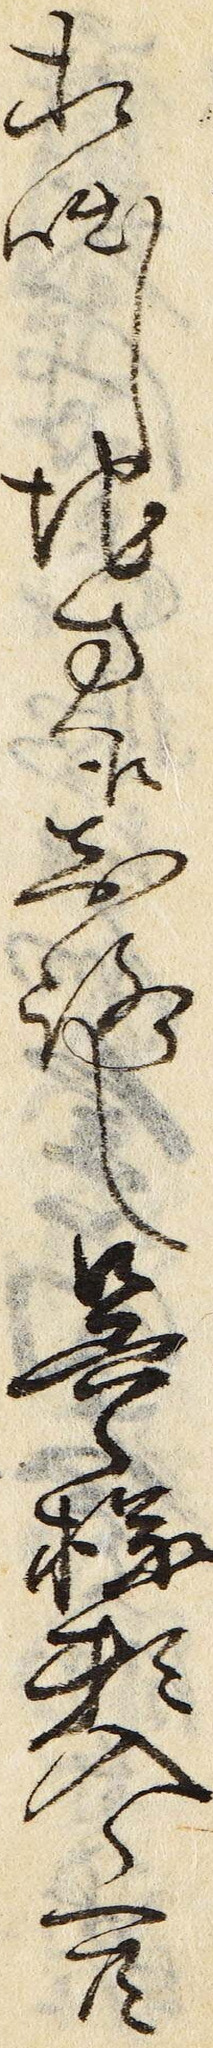相咄し地方えおろし呉候様頼入候へ共
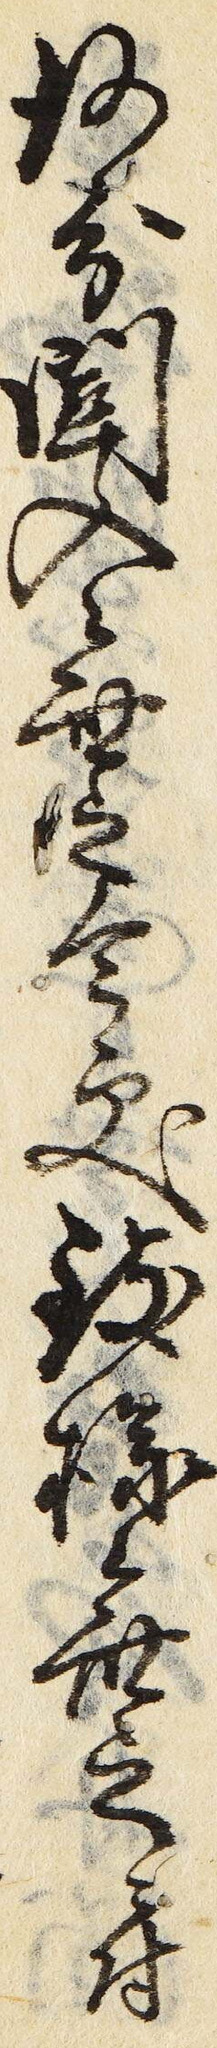何分聞入無之今更致様無之ニ付
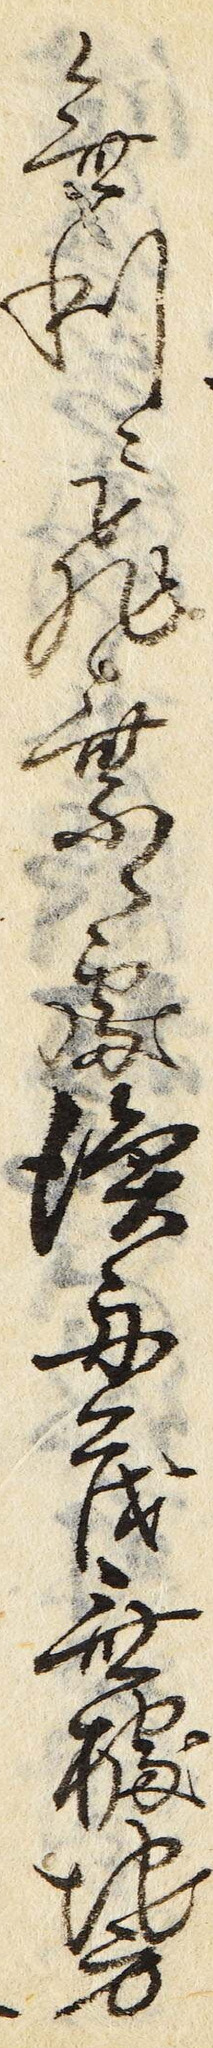無利ニ飛乗候処漁舟も無拠地方
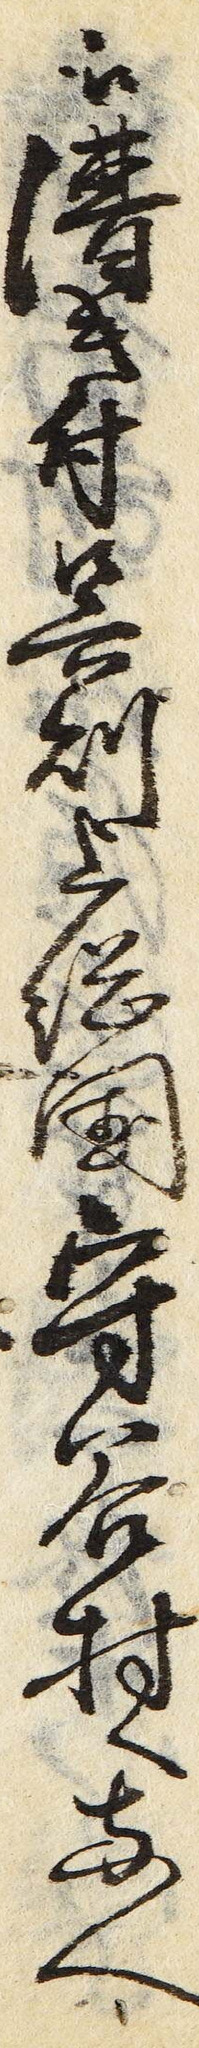え漕き付呉則上総国守谷村へ両人
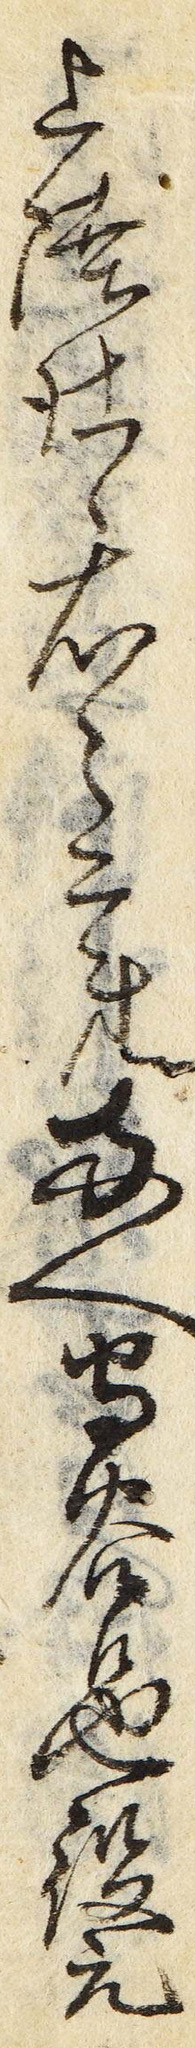上陸仕候右之両人守谷邑役元
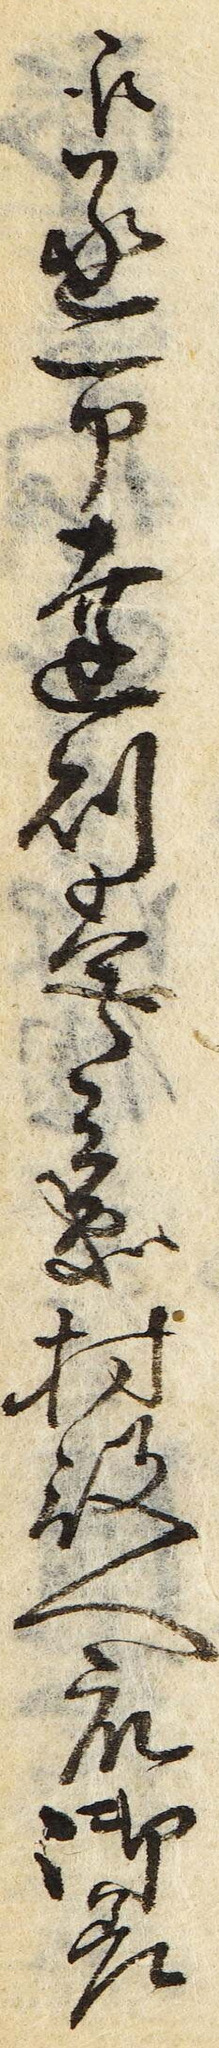え逐一申達則太郎兵衛村役人衆御差

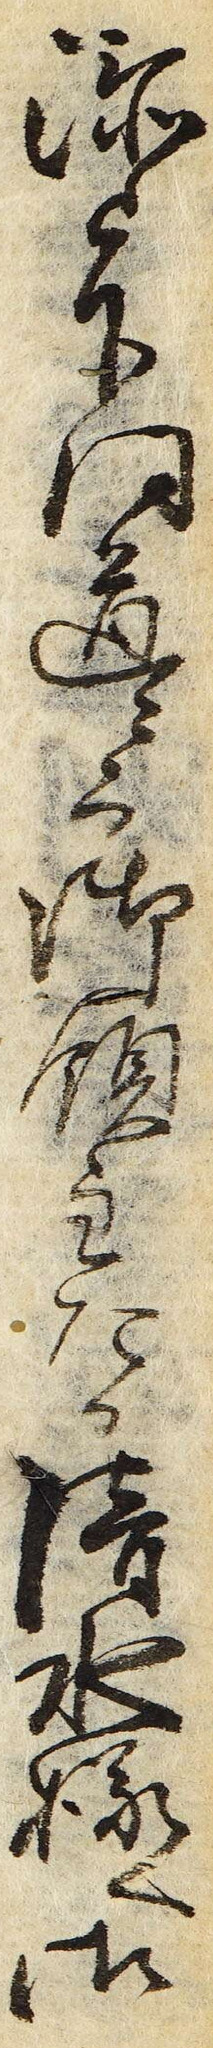添被下同道ニ而御領主たる清水様へ御
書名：阿波幸宝丸漂流記
